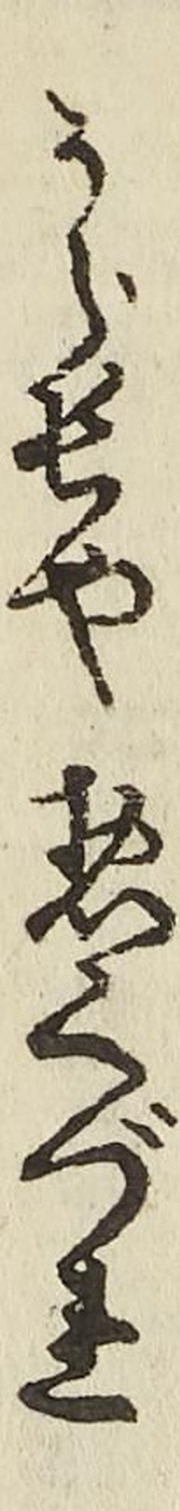うら長や惣くづれ
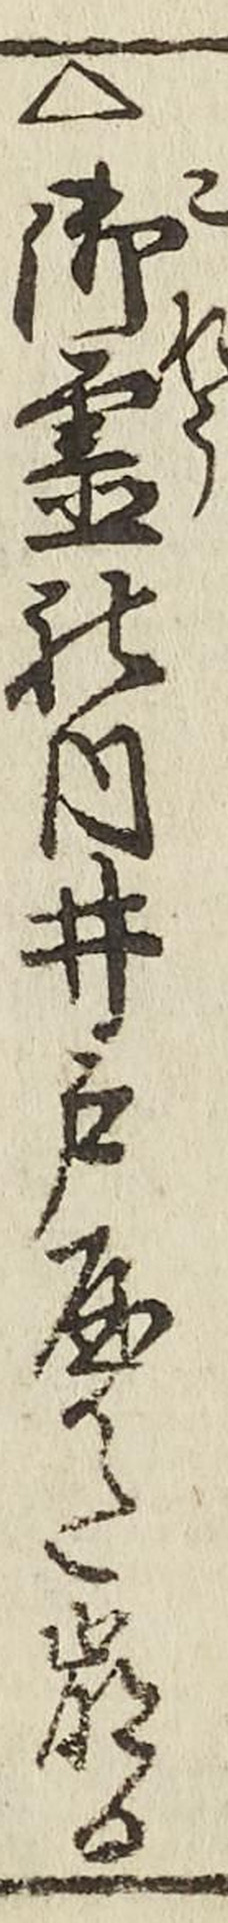△御霊社内井戸屋かた崩る
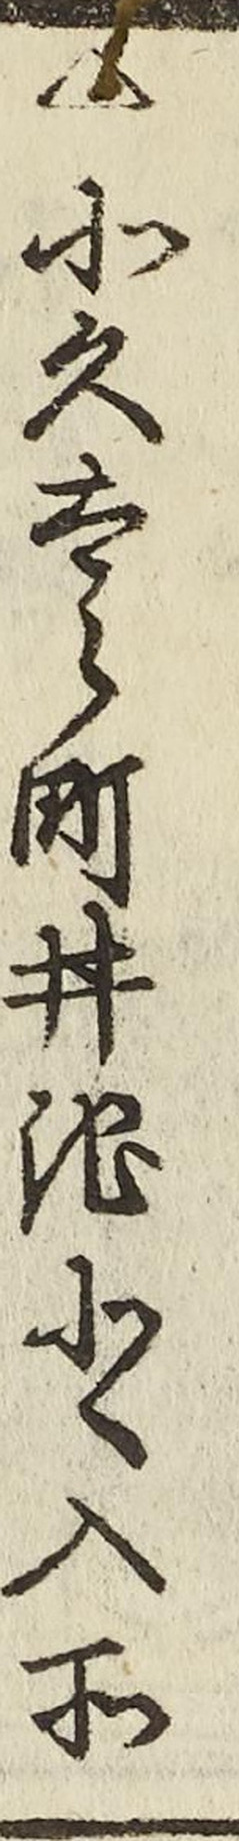△北久太郎町丼池北へ入所
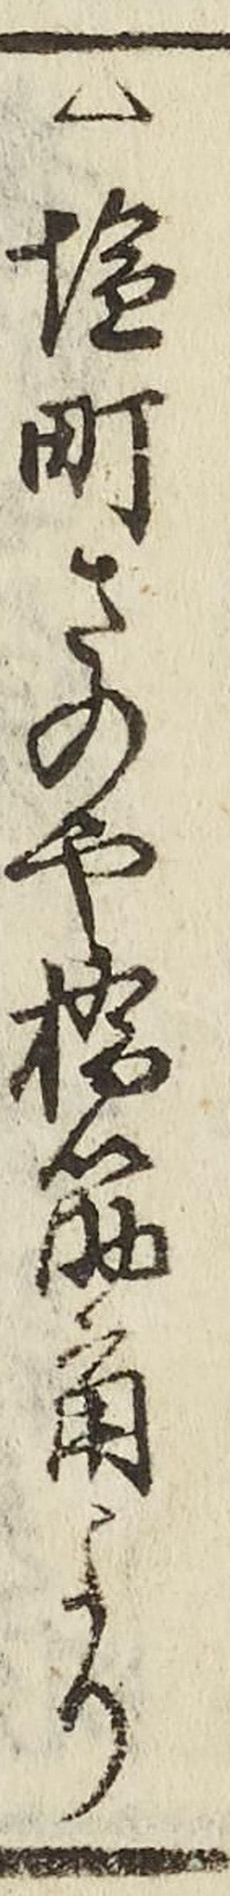△塩町さのや橋筋角より
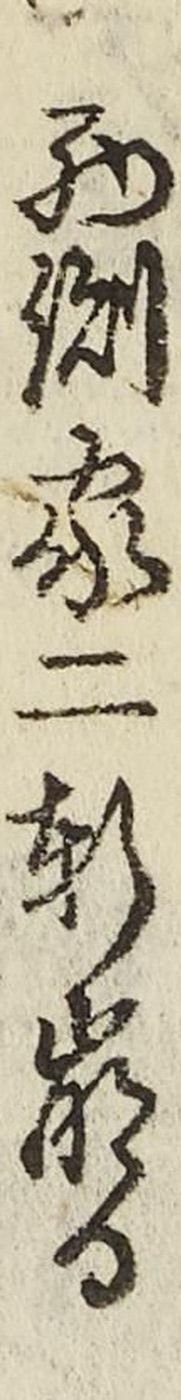西側家二軒崩る
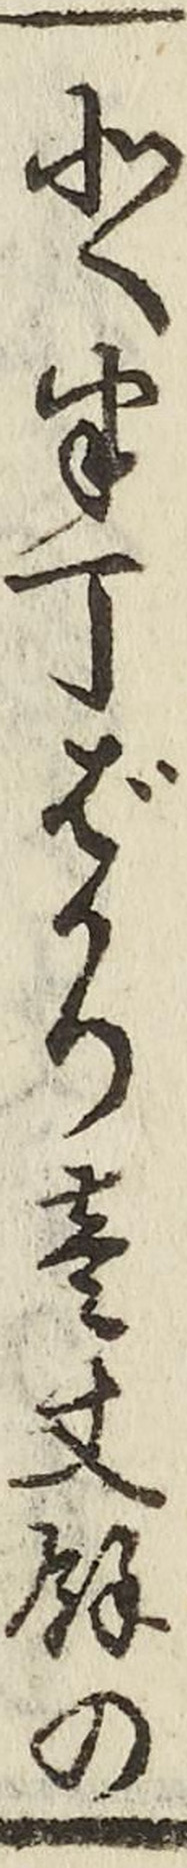北へ半丁ばかり壱丈余の
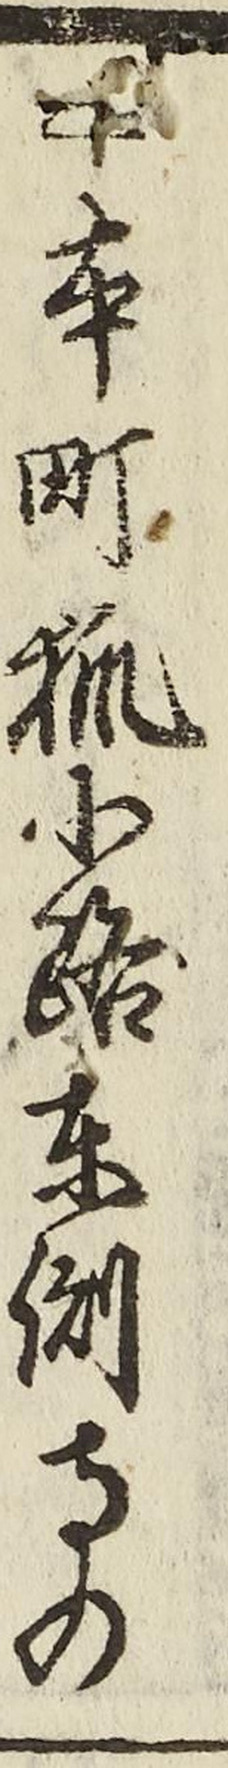△本町狐小路東側寺の
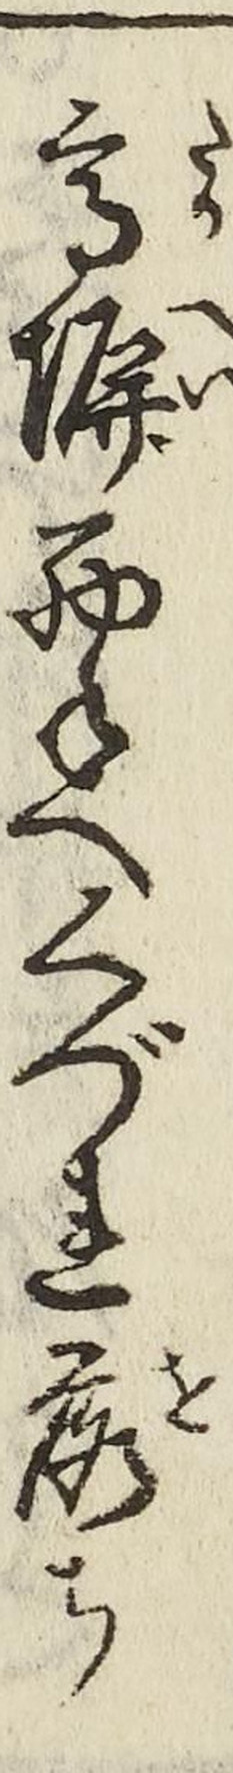高塀西手へくづれ落ち
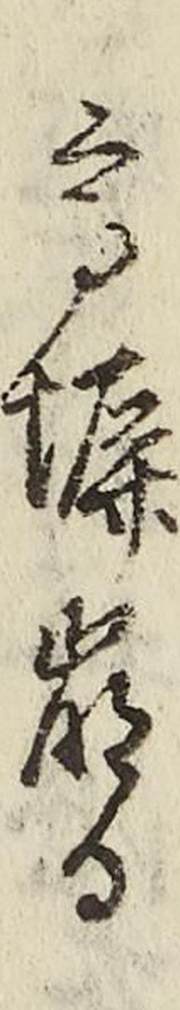高塀崩る
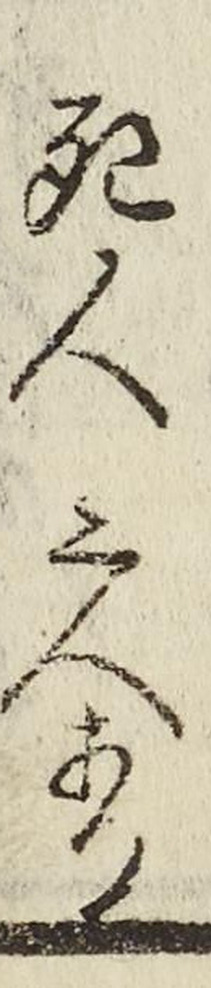死人二人あり
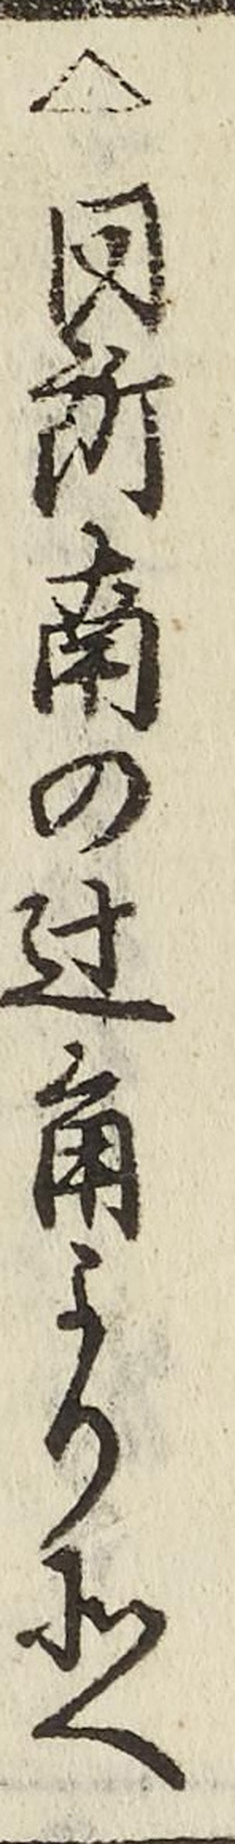△同所南の辻角より北へ
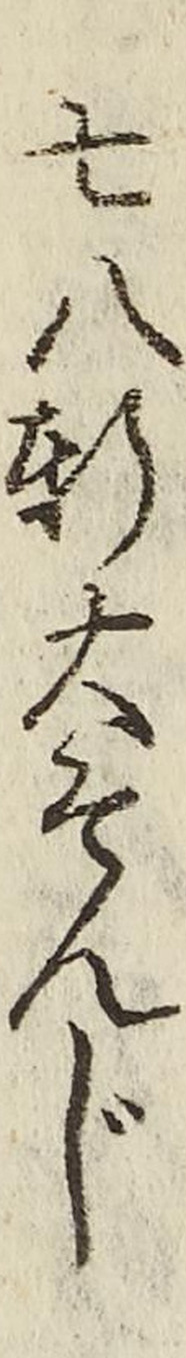七八軒大そんじ
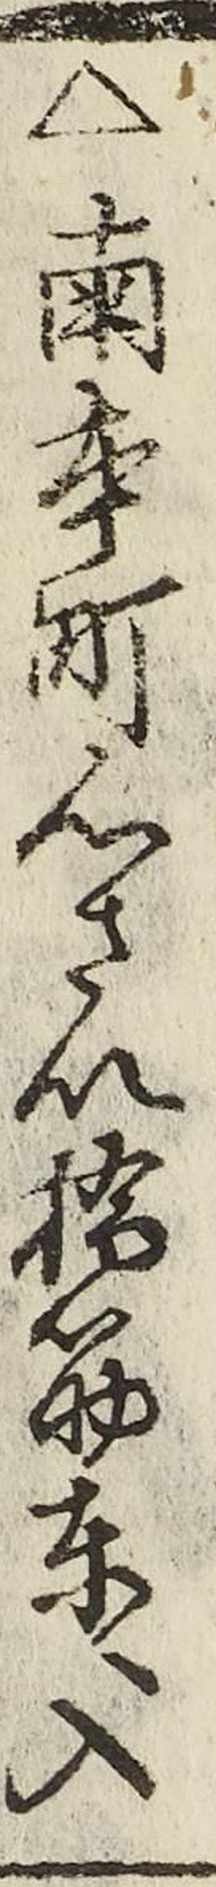△南本町心さい橋筋東へ入
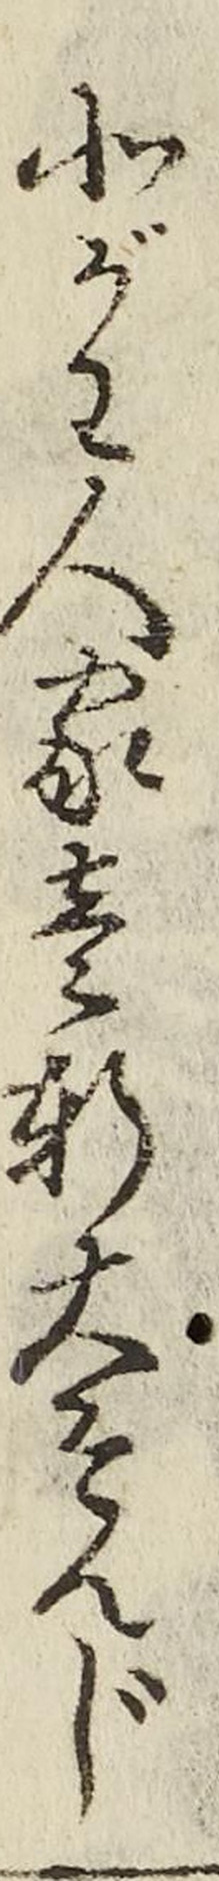北がわ人家壱軒大そんじ

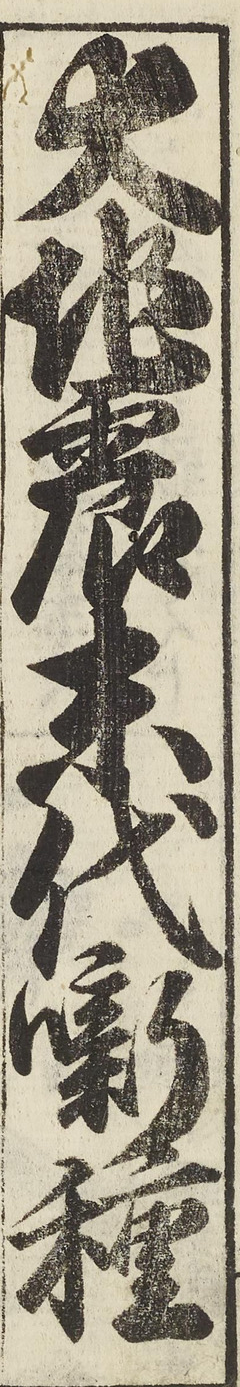大地震末代噺種
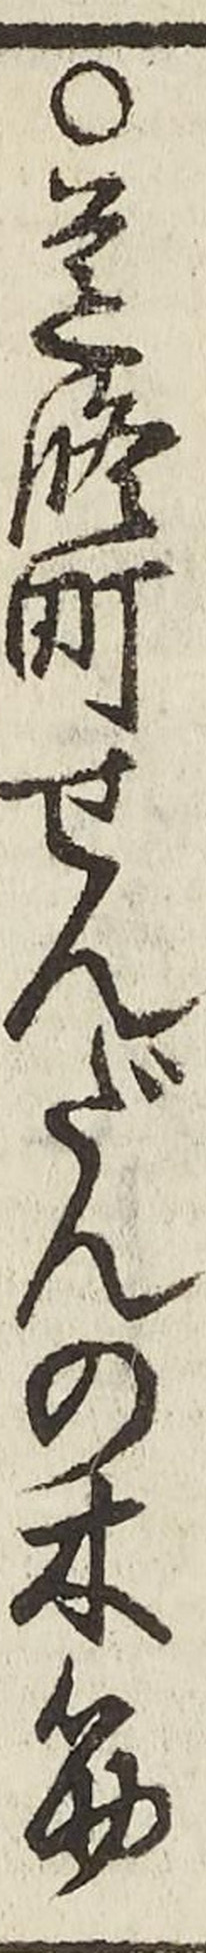〇道修町せんだんの木筋
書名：地震津浪末代噺の種　全
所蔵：東京大学地震研究所図書室 Earthquake Research Institute Library, The University of Tokyo, JAPAN
